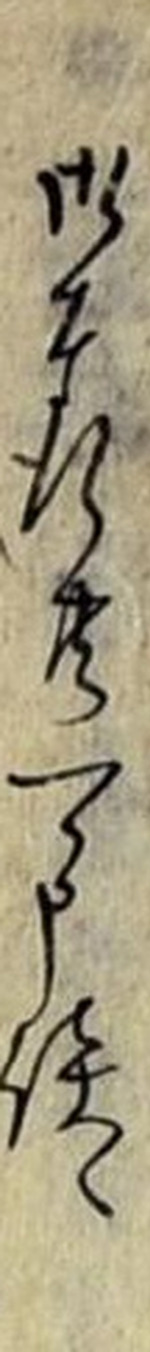御奉行共可申談候
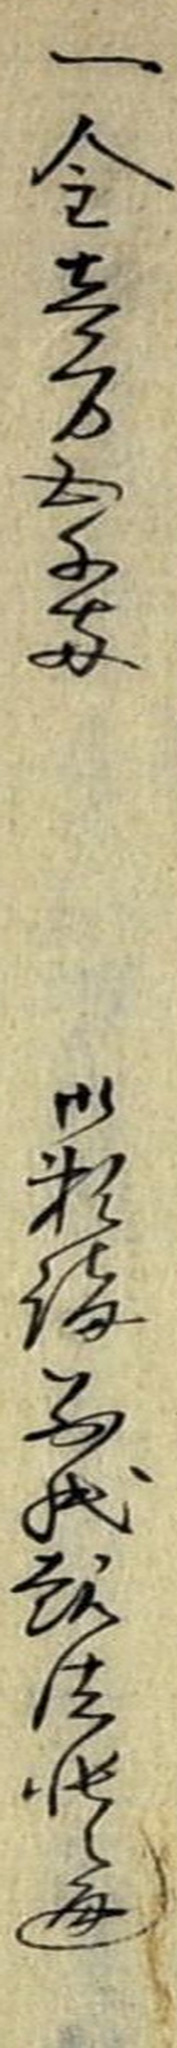一金壱万五千両御頼講別紙趣法帳之通
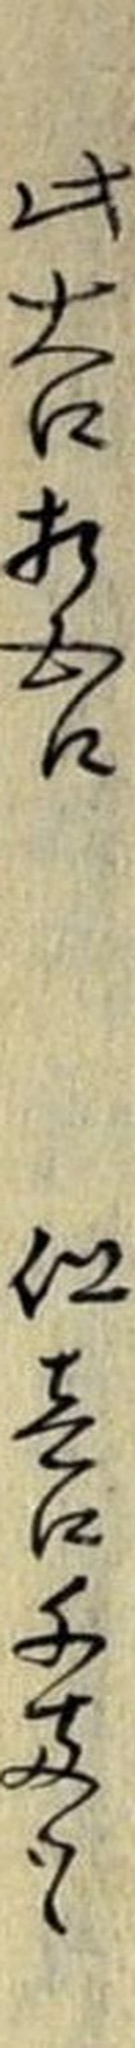此大口拾五口但壱口千両つヽ
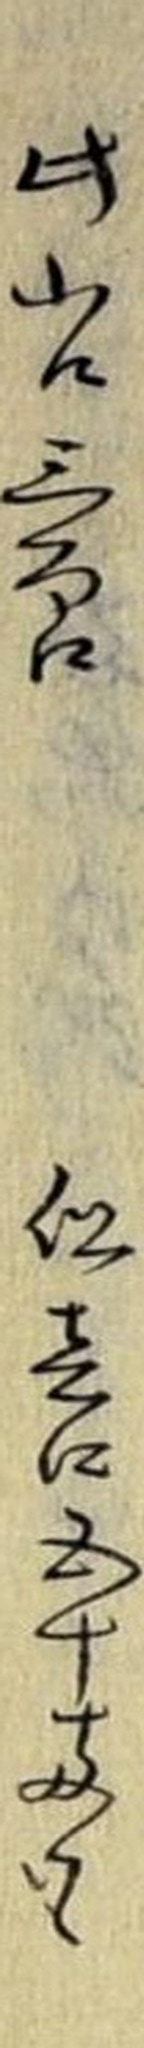此小口三百口但壱口五十両つヽ
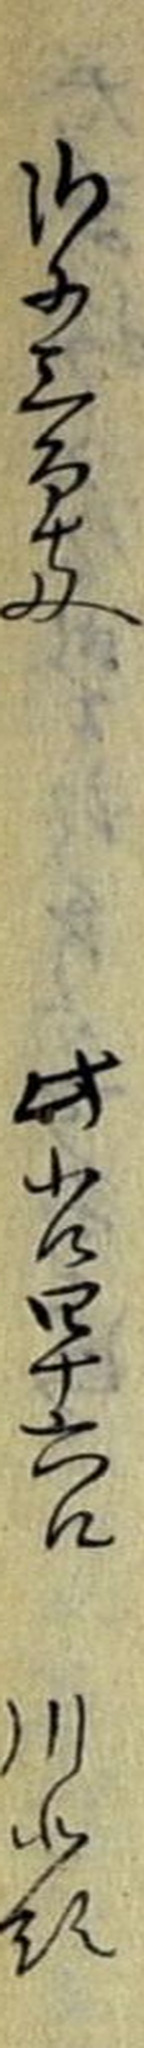弐千三百両此小口四十六口川北領
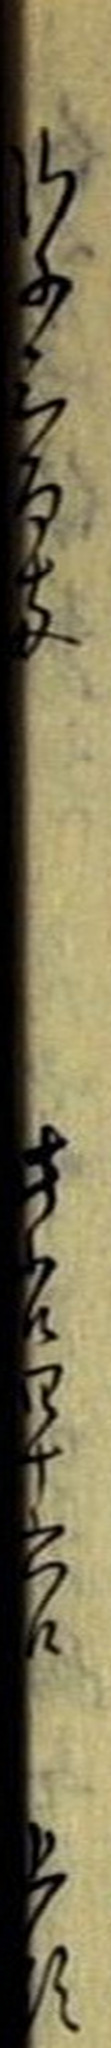弐千三百両此小口四十六口上領
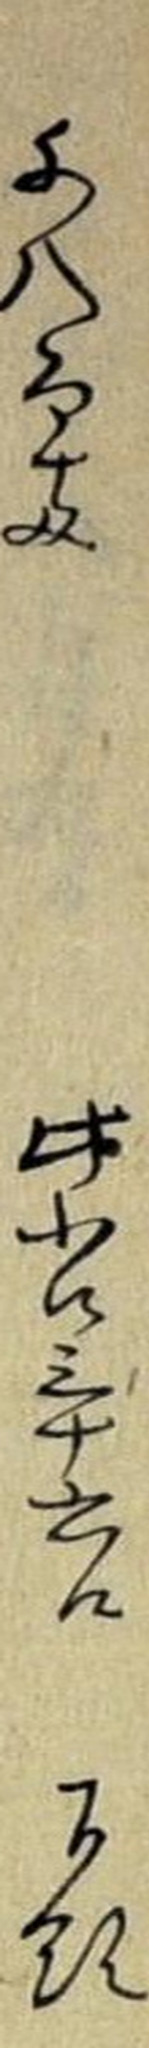千八百両此小口三十六口下領
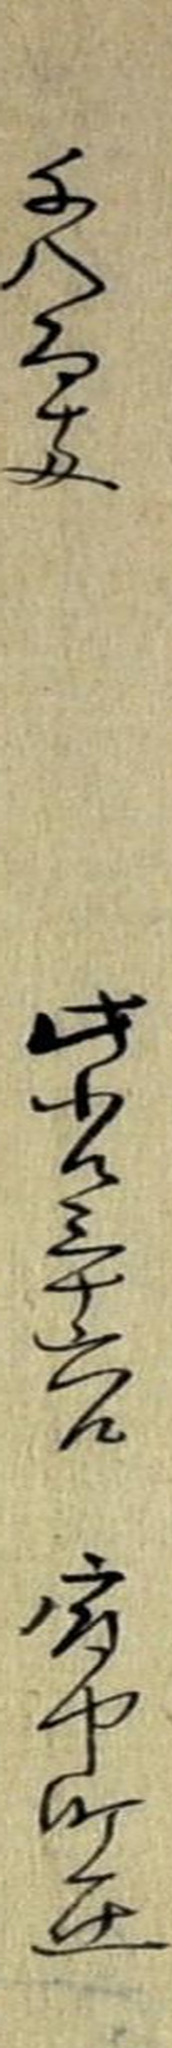千八百両此小口三十六口府中町在
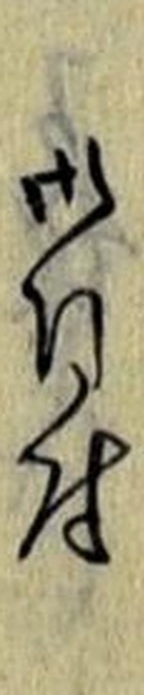御目付
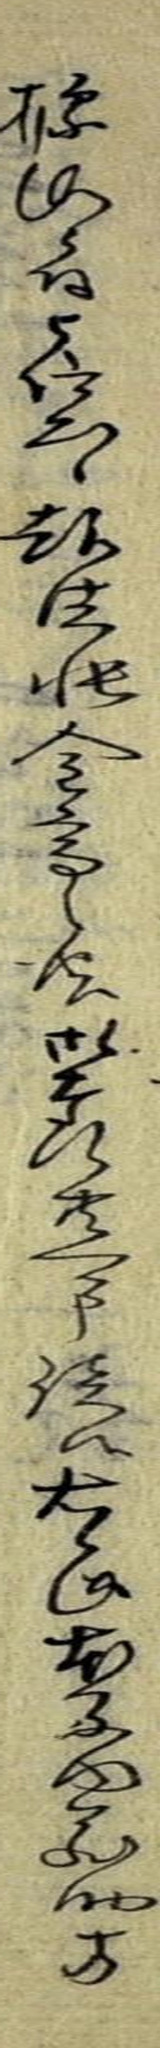拠趣に付被仰付候趣法帳金高之儀は御奉行共可申談候右之趣本多内蔵助方
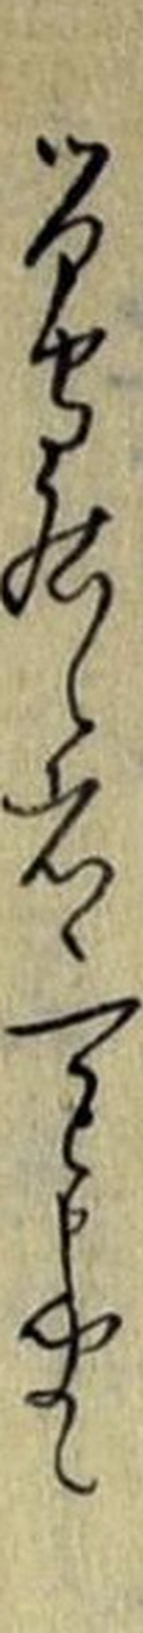留守居之者へ可被申聞候
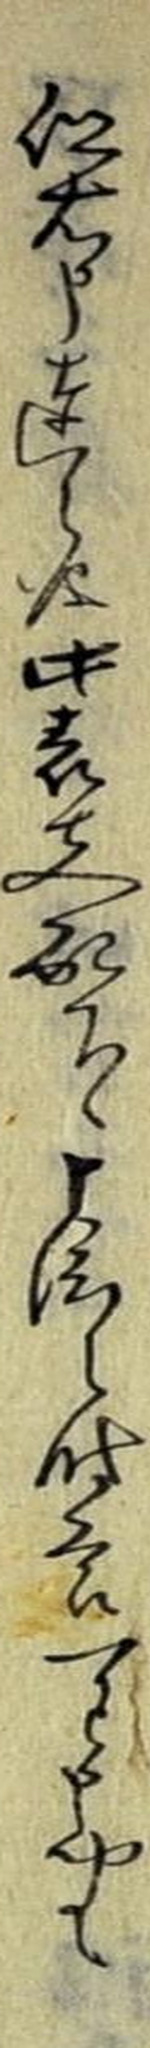但右申達之儀此表支配下へ申渡候時節可被申聞候
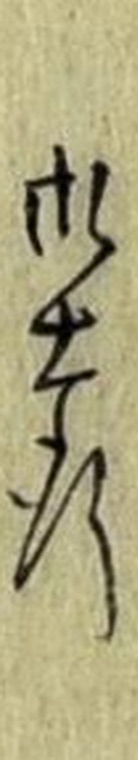御奉行
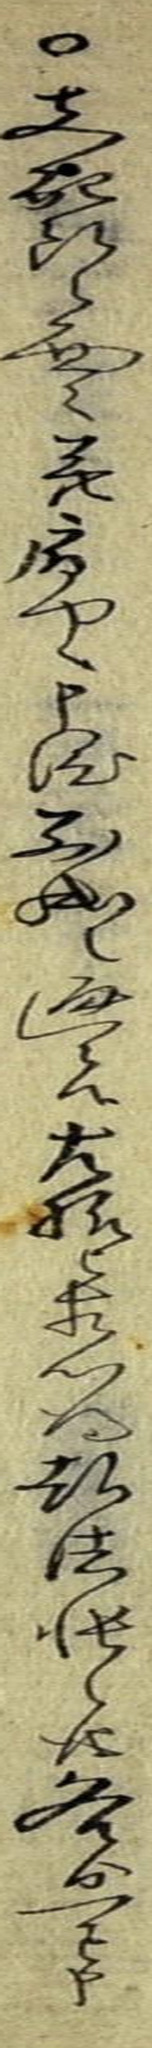○支配頭之面々并府中へ申渡別紙之通に候左様被相心得趣法帳之儀各ゟ可被申
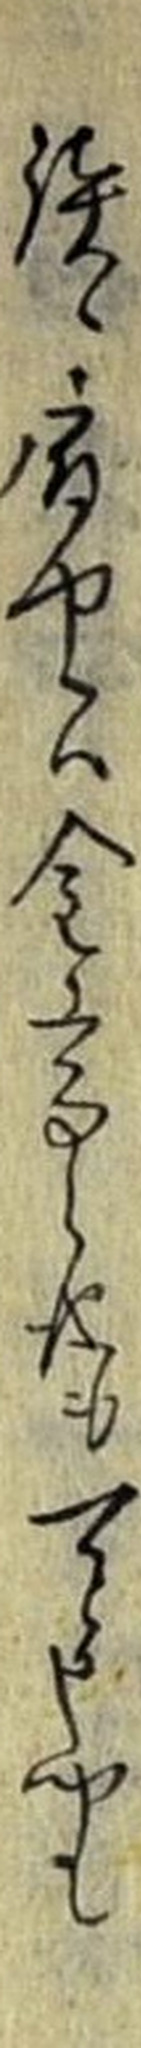談候府中へは金高之儀も可被申聞候
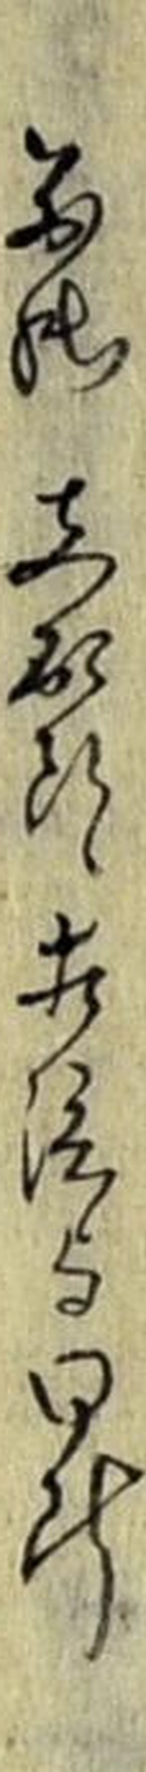別紙支配頭へ相渡と同断
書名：命令之部 四
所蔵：福井県文書館 Fukui Prefectural Archives
